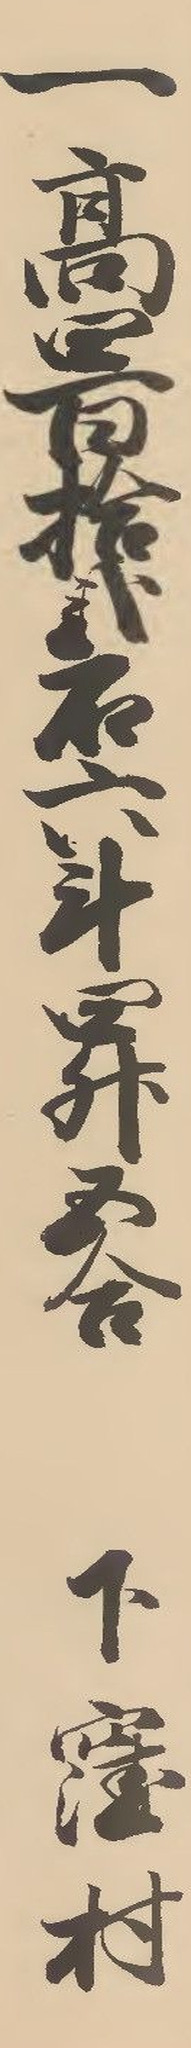一高四百拾弐石六斗四升五合下窪村
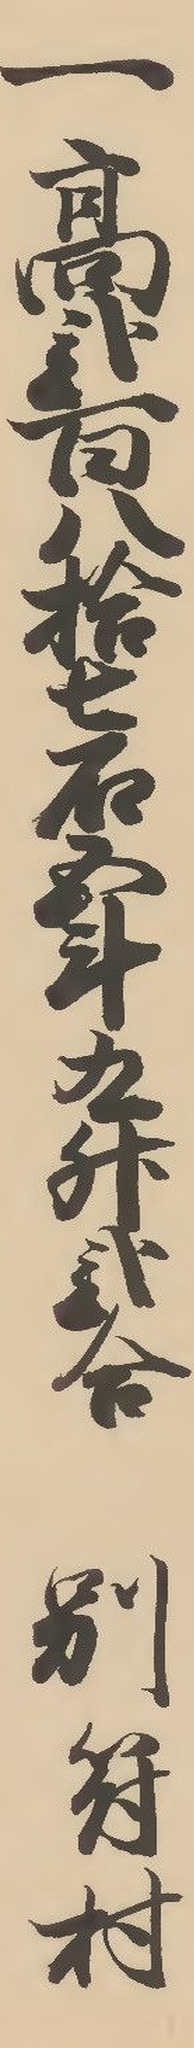一高弐百八拾七石五斗九升弐合別符村
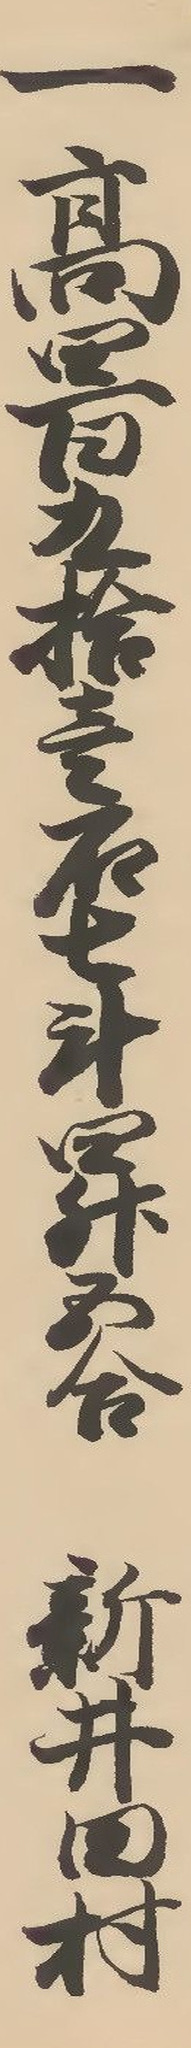一高四百九拾壱石七斗四升五合新井田村

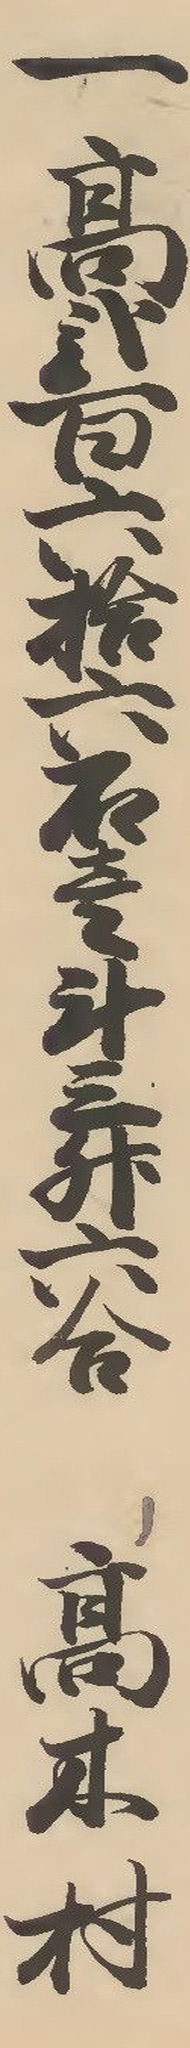一高弐百六拾六石壱斗三升六合高木村
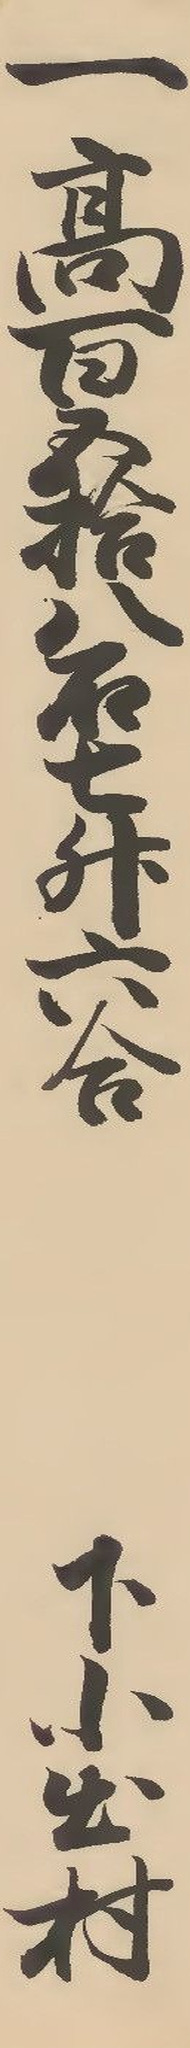一高百五拾八石七升六合下小出村
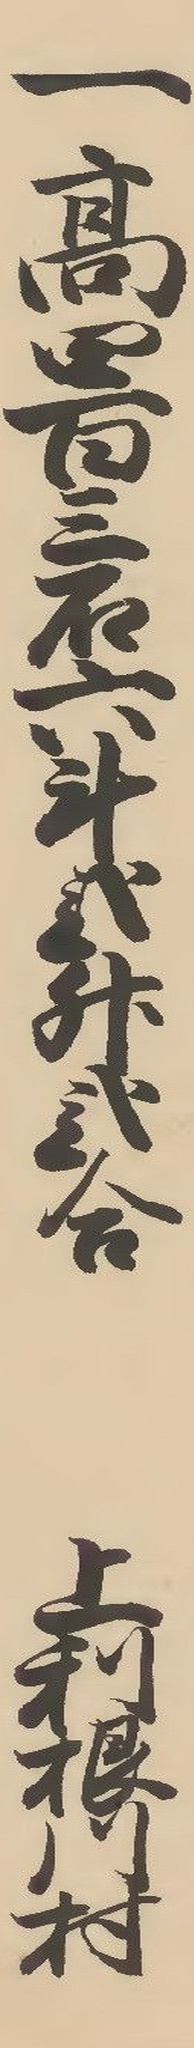一高四百三石六斗弐升弐合上利根川村
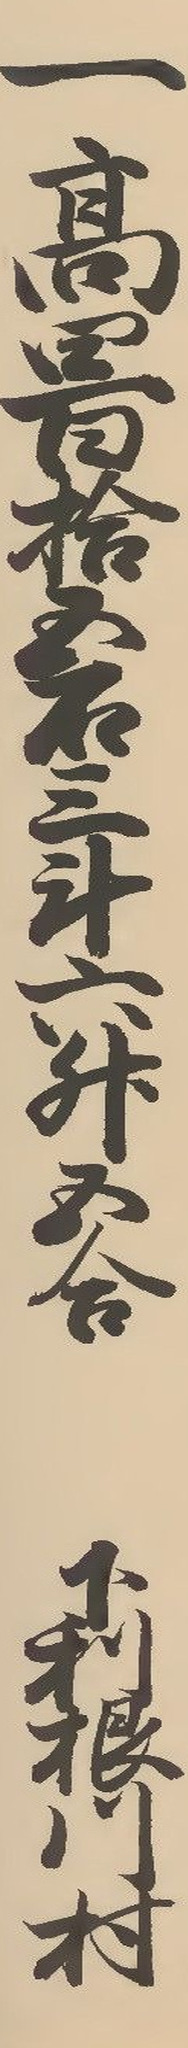一高四百拾五石三斗六升五合下利根川村
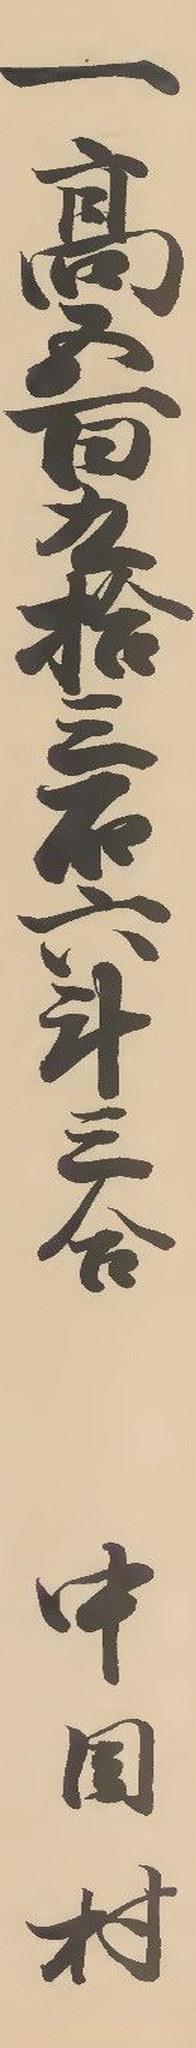一高五百九拾三石六斗三合中目村
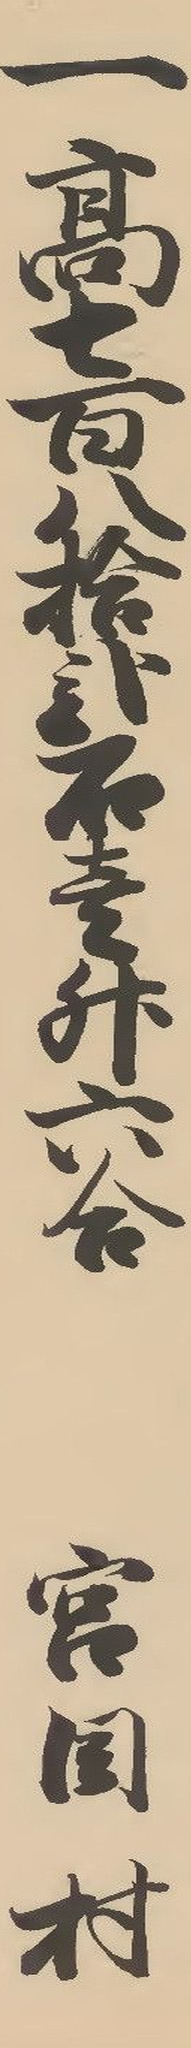一高七百八拾弐石壱升六合宮目村
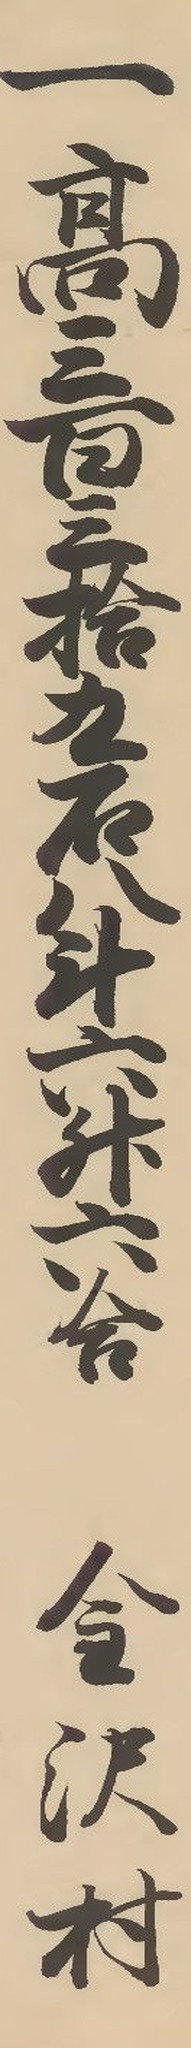一高三百三拾九石八斗六升六合金沢村
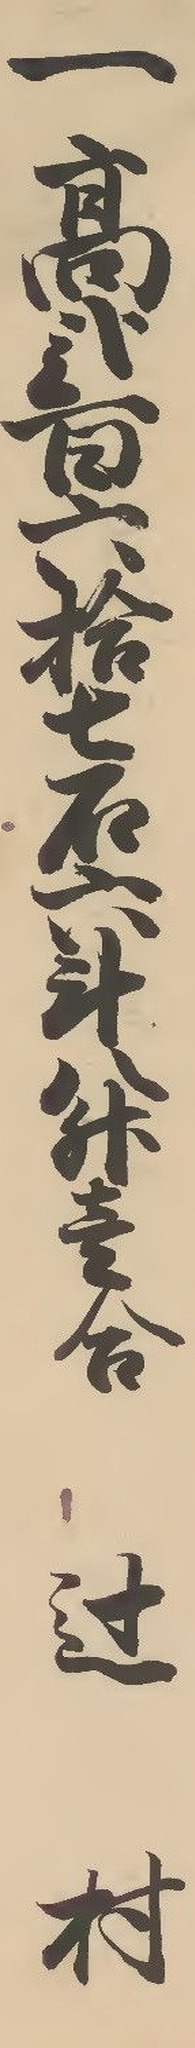一高弐百六拾七石六斗八升壱合辻村

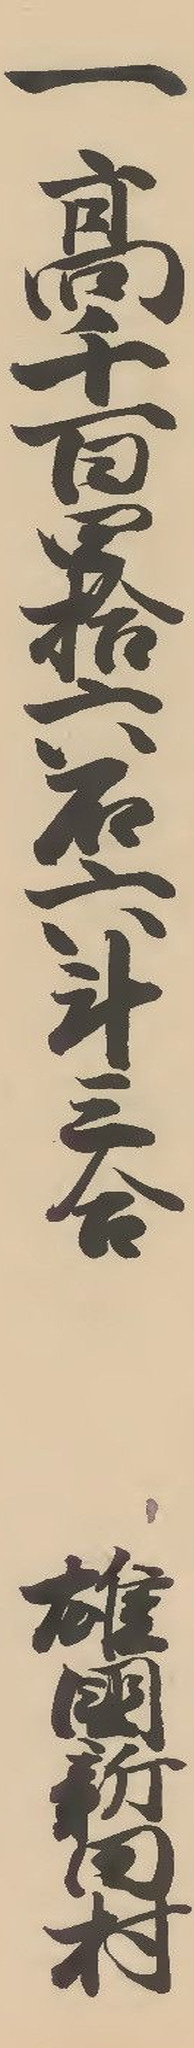一高千百四拾六石六斗三合雄国新田村
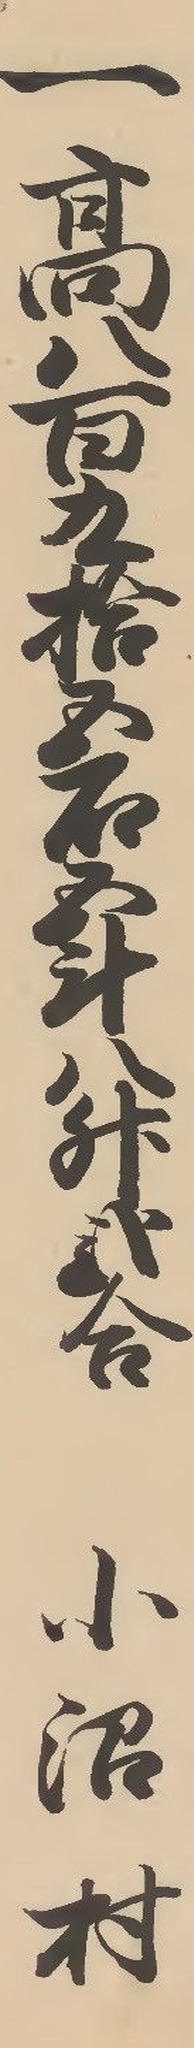一高八百九拾五石五斗八升弐合小沼村
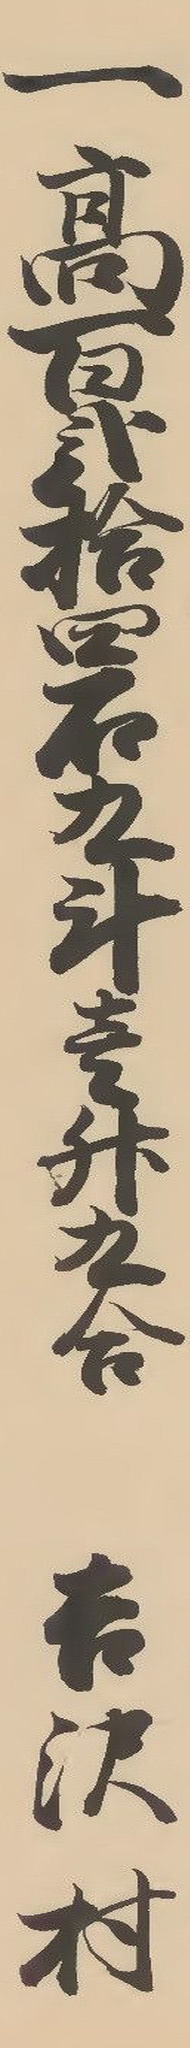一高百弐袷四石九斗壱升九合吉沢村
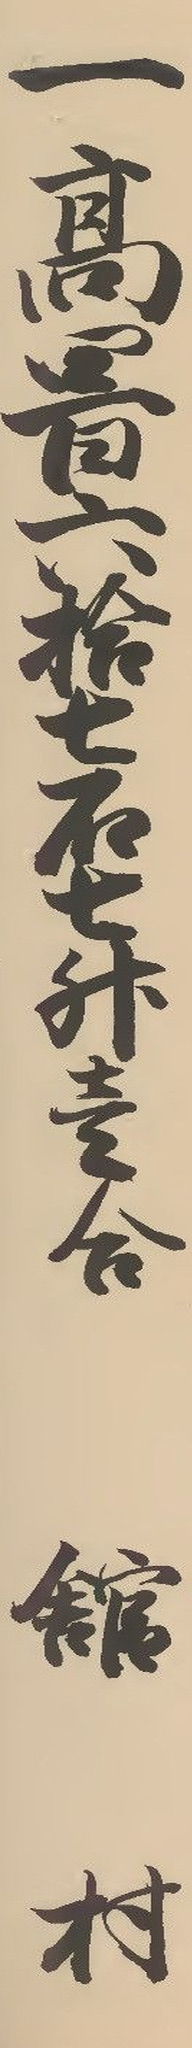一高四百六拾七石七升壱合館村
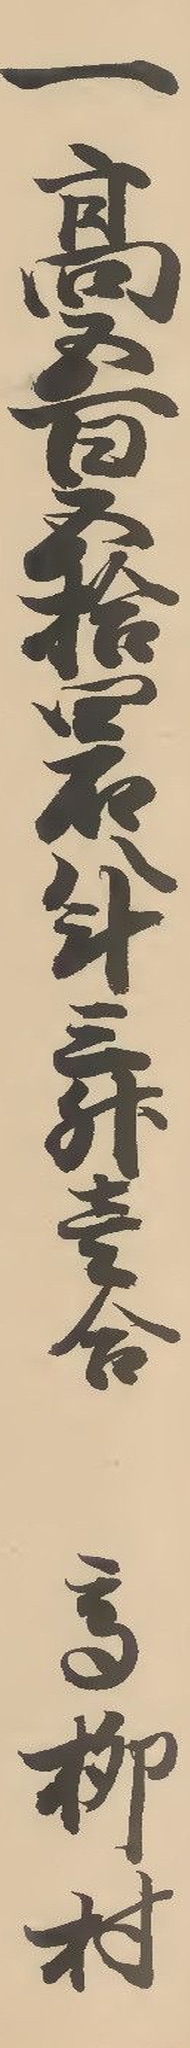一高五百五拾四石八斗三升壱合高柳村
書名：陸奥国郷帳　１
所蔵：国立公文書館 National Archives of Japan
